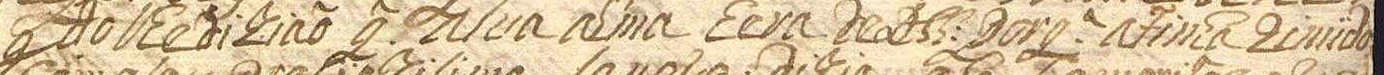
qdo lhe diziaõ q̄ a sua alma hera de DSs: porq.a a tinha remida
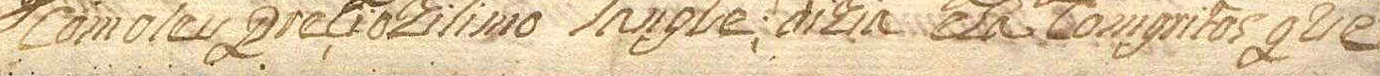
Com o seu preciozisimo sangue; dizia ela com gritos que
